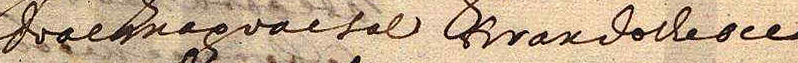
doa em agoa e sal tirandolhe o ce
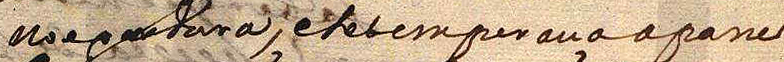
uo e gordura, e se temperaua a pane
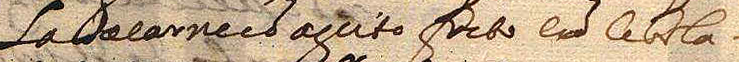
La da carne cō azeite frito cō cebola
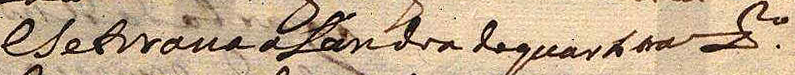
e se tiraua a Landoa do quarto trazro.
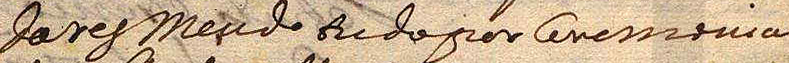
da res meuda tudo por ceremonia
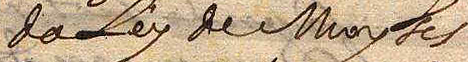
da Ley de Moyses
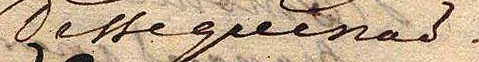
Disse que naõ
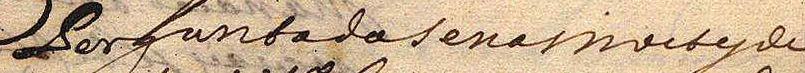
Perguntada se nas noites de
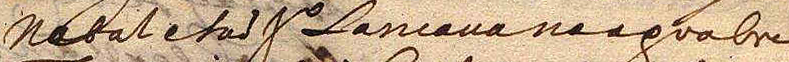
natal e saõ Jo Lancaua na agoa bra
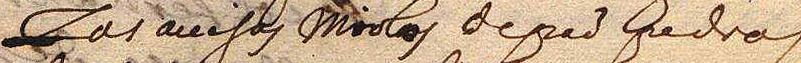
Zas accesas miolos de paõ pedras
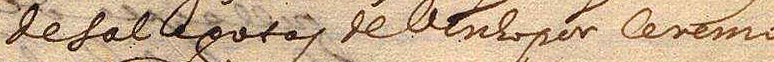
de sal e gotas de vinho por ceremo
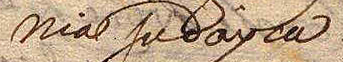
nia Judayca
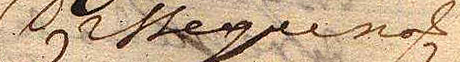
Disse que naõ
